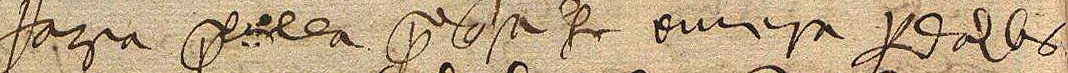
fazia p̄o ella p̄oq̄ ja lhe ouuera ꝑdā dos
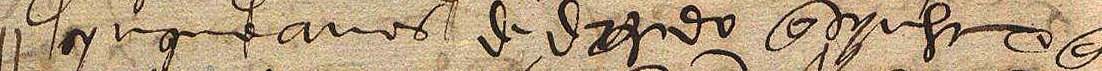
cynquo anos de degredo q̄ tynha e q̄
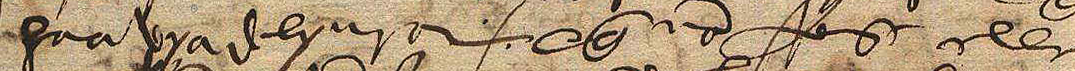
ha avya de lyurar ./. e q̄ nā ffose elle
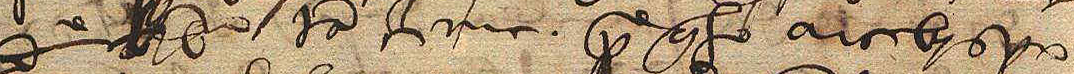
do Ribro tā c̄ime. p̄oq̄ ho arcebyspo
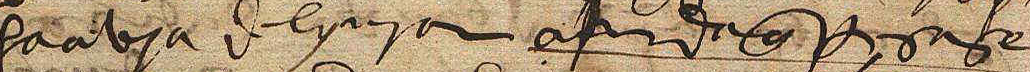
ha avya de lyurar aJnda q̄ pesase
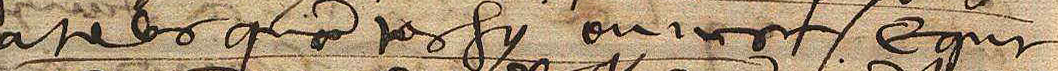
a todos quātos hy ouuese /. E que
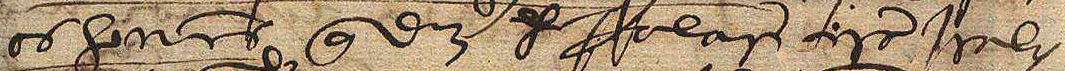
os homēs q̄ diz lhe ffalarē erā Jtaly
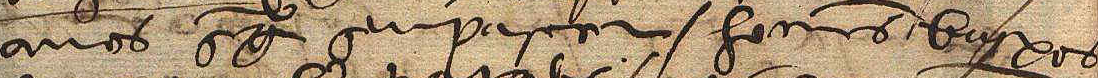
anos segdo seu pareser / homēs bajxos
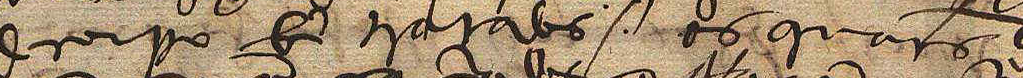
de corpo bē tratados ./. os quaes dj
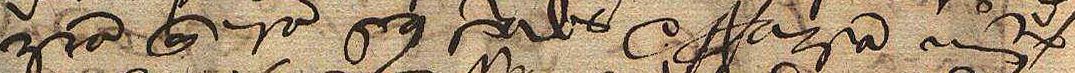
ziā q̄ erā seꝯ c̄iados e ffaziā mto
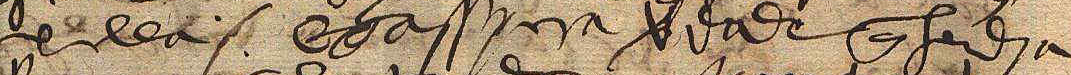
p̄o ella ./. E q̄ assy era ꝟdade q̄ ho dja
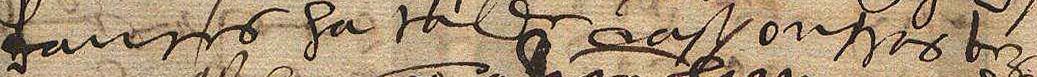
dantes ha tarde e asy outras vezes
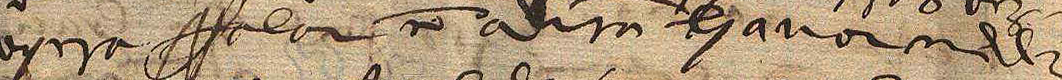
vyra ffalar c̄o a dita ljanor mēdez
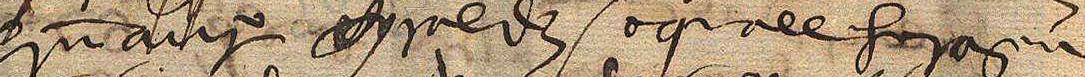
hū anto gyraldez / o quall hera seu
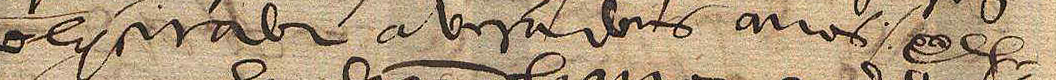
solycitador avera dous anos ./ e lhe
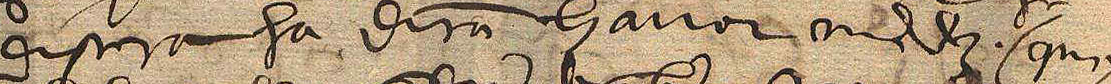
disera ha dita ljanor mēdez ./ quej
